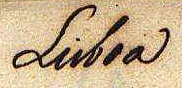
Lisboa
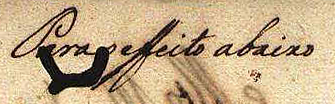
Para o effeito abaixo
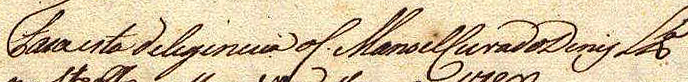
Fara esta deligencia o C. Manoel Curado Denis Lxa
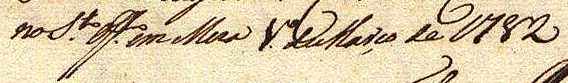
no S.to off. em Meza 1.o de Março de 1782
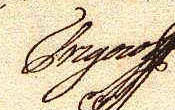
Fragozo
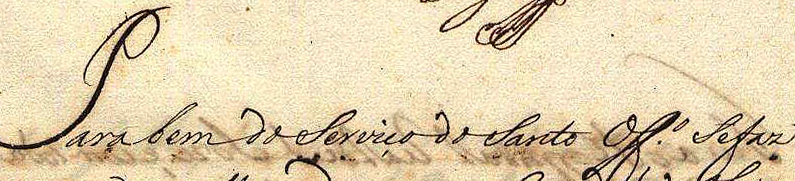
Para bem do Serviço do Santo Off.o Se faz
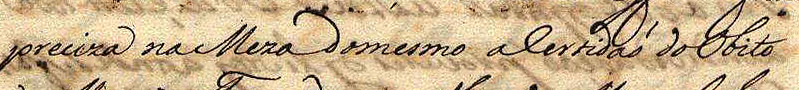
preciza na Meza do mesmo a Certidaõ do Obito
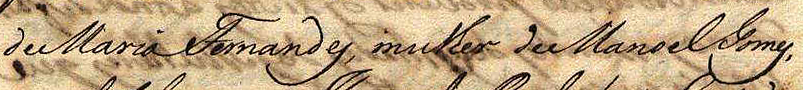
de Maria Fernandes, mulher de Manoel Gomes,
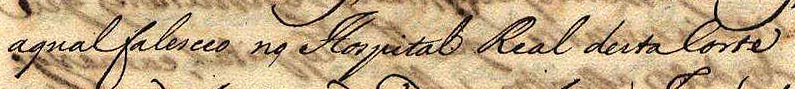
a qual falesceo no Hospital Real desta Corte
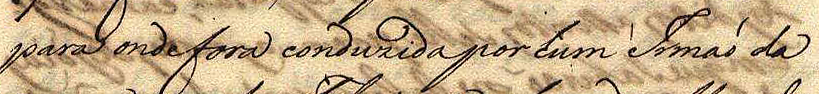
para onde fora conduzida por hum Irmaõ da
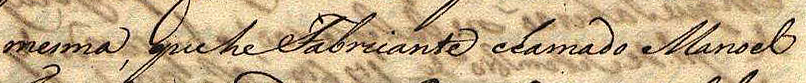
mesma, que he Fabricante chamado Manoel
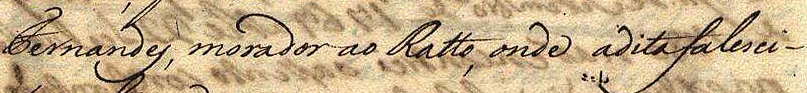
Fernandes morador ao Ratto, onde a dita falesci
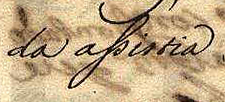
da assistia
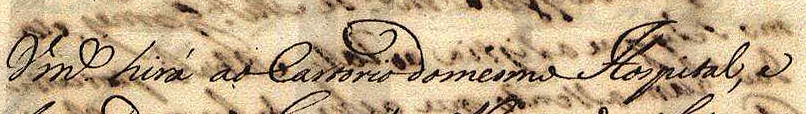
V m.e hirá ao Cartorio do mesmo Hospital, e
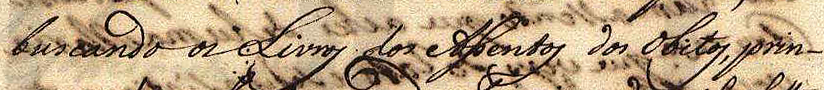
buscando os Livros dos Asentos dos obitos, prin
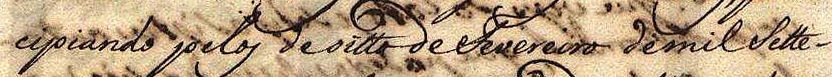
cipiando pelos de oitto de Fevereiro de mil Sette
